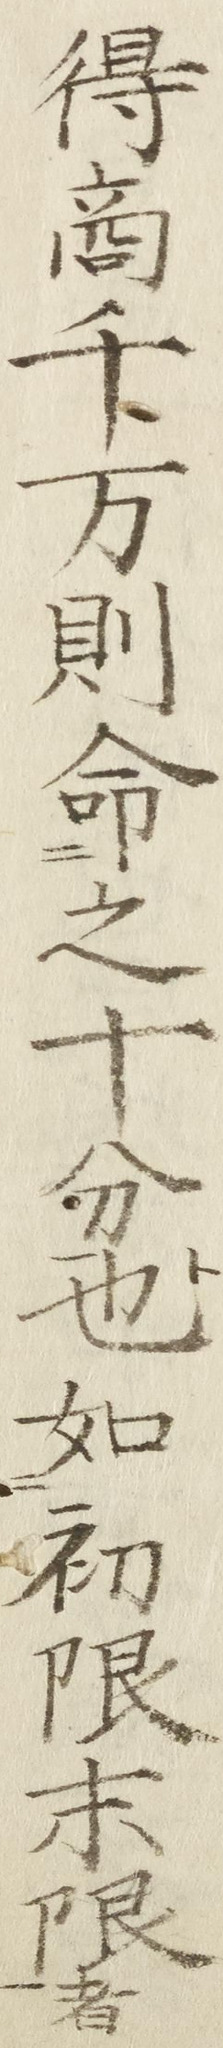得商千万則命之十分也如初限末限者

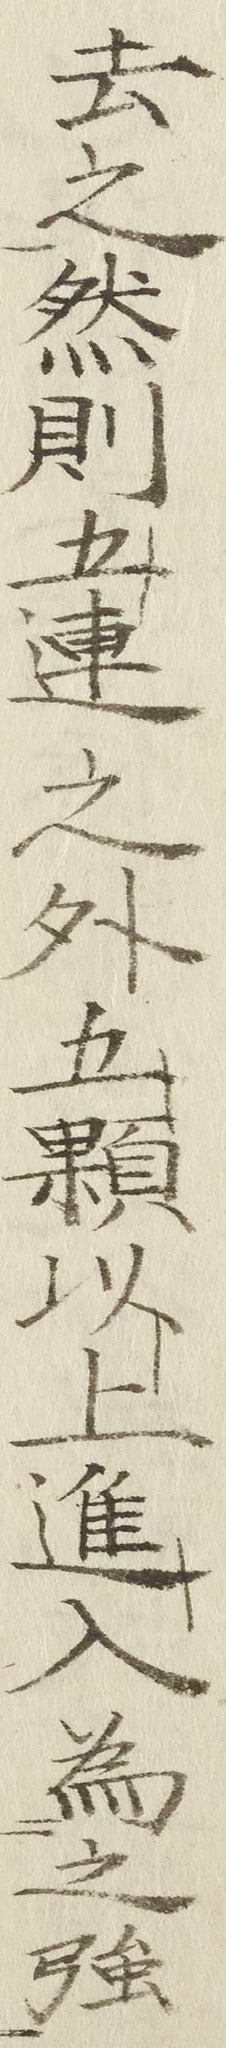去之然則五連之外五顆以上進入為之強
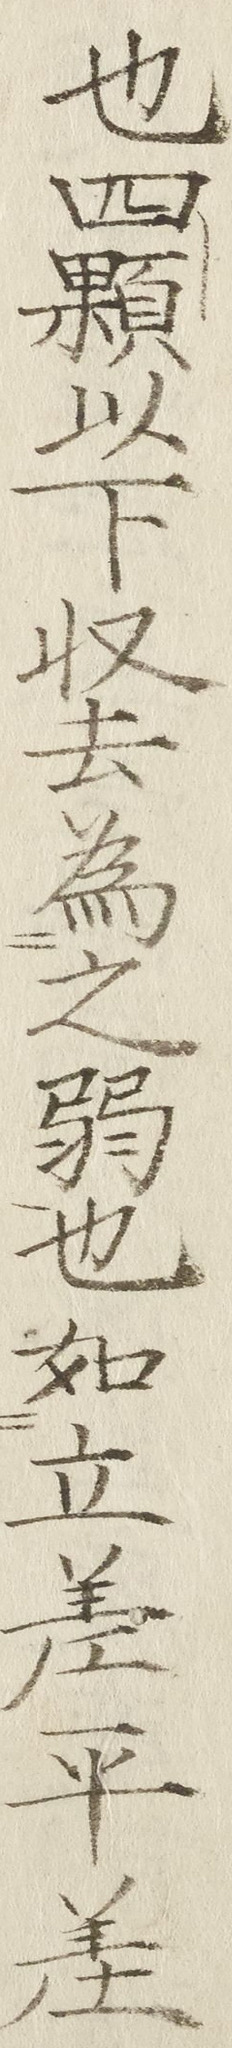也四顆以下収去為之弱也如立差平差
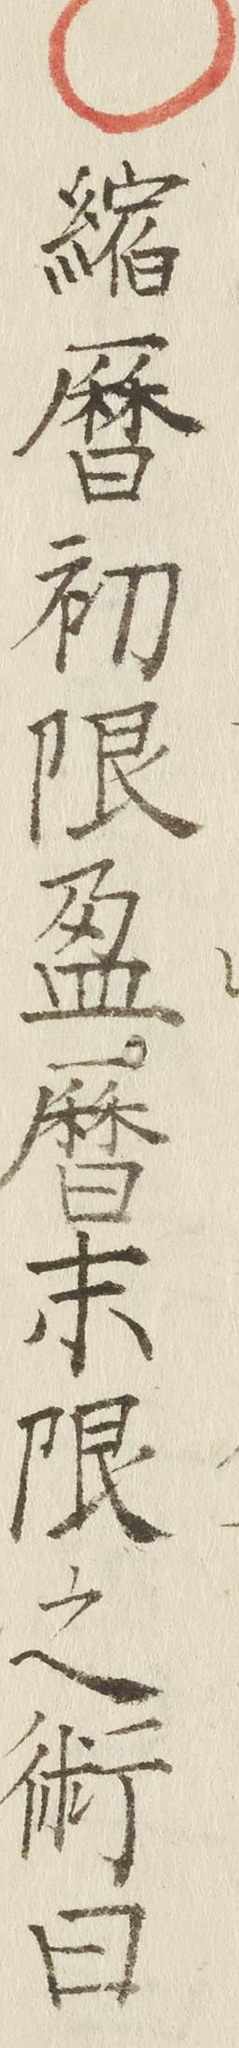○縮暦初限盈暦末限之術曰
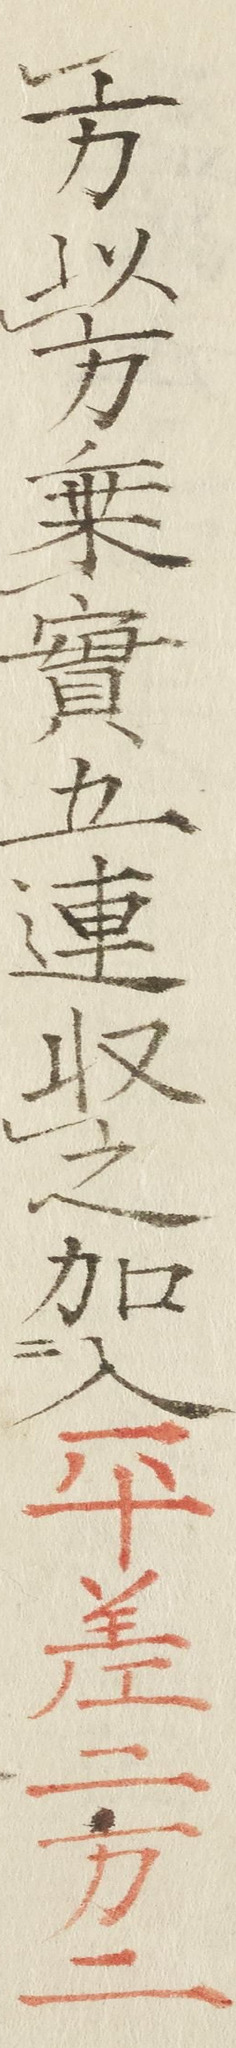方以方乗実五連収之加入平差二万二
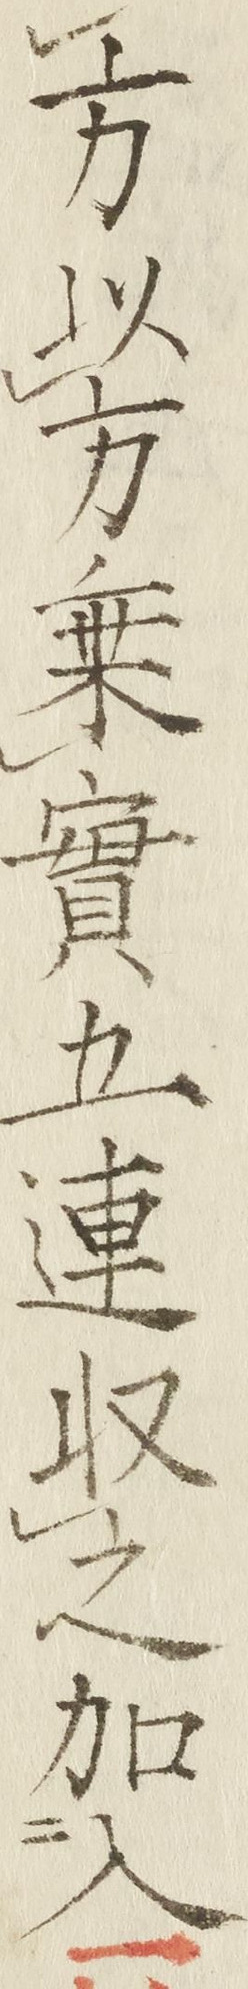為方以方乗実五連収之加入平差二
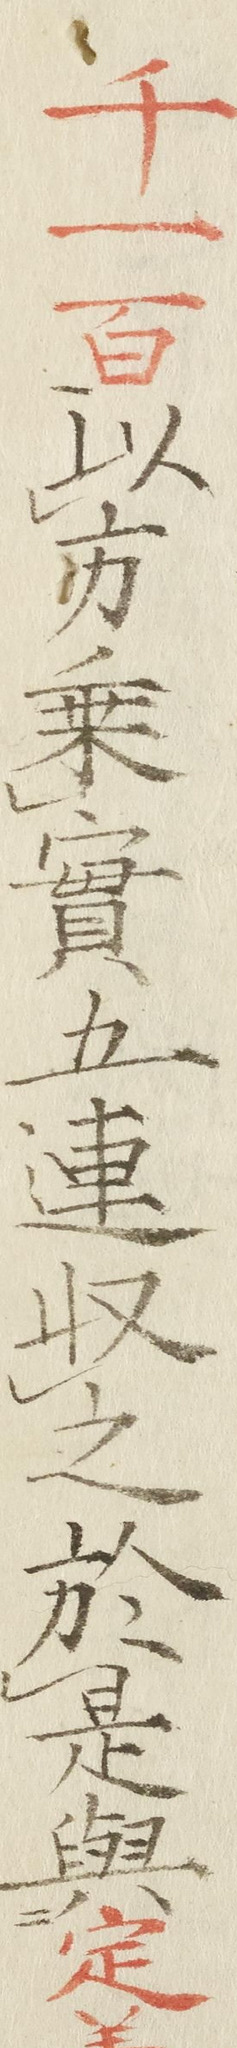千一百以方乗実五連収之於是与定差
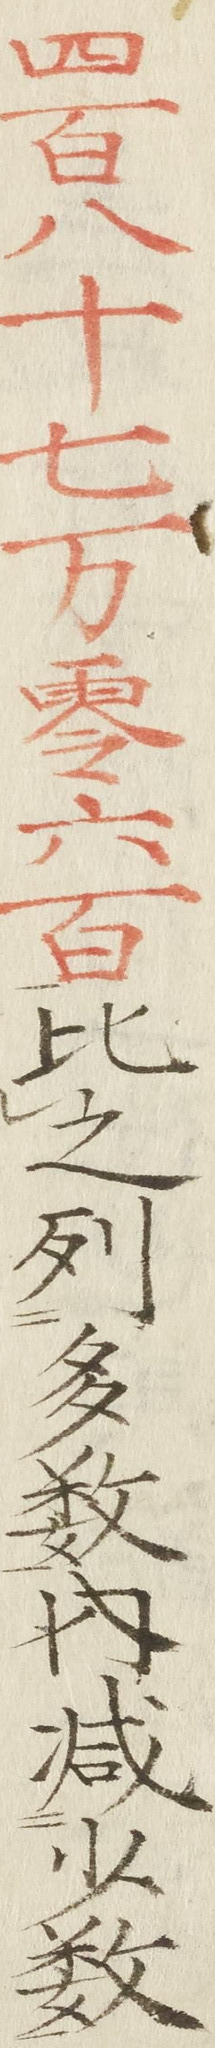四百八十七万零六百比之列多数内減少数
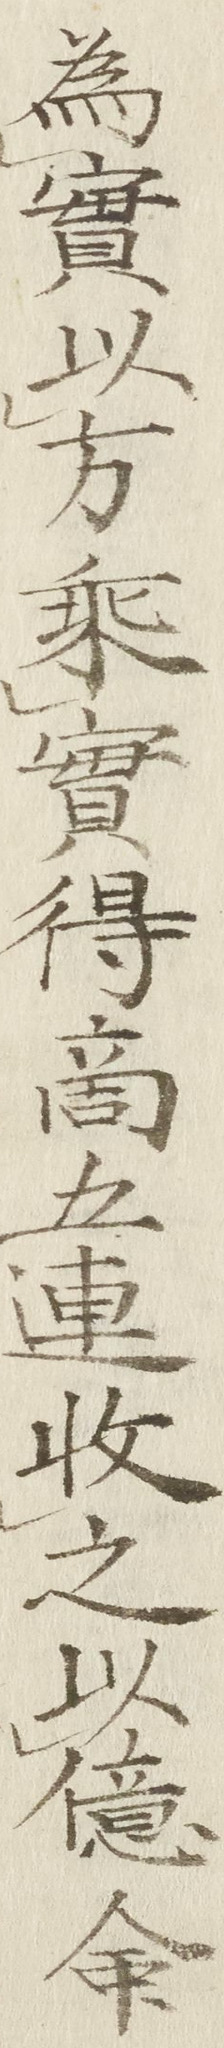為実以方乗実得啇五連収之以億命
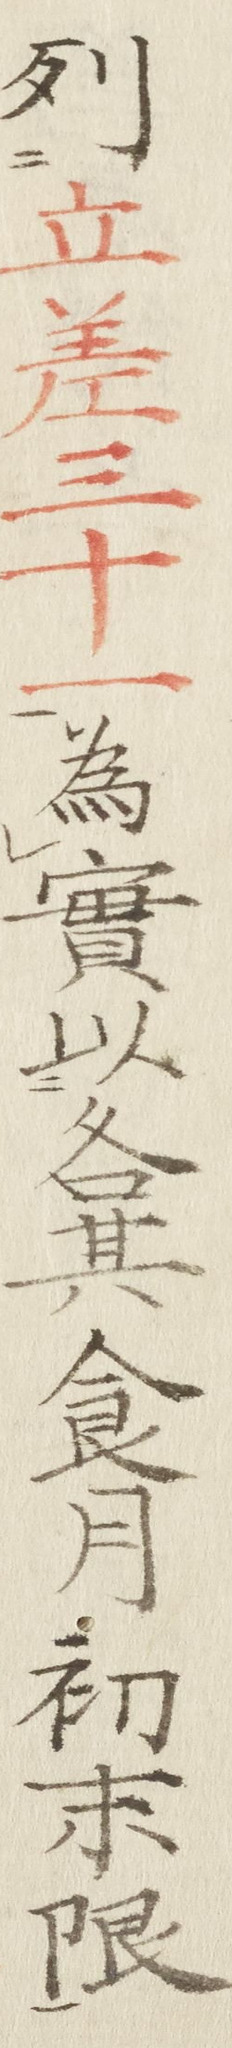列立差三十一為実以各其食月初末限
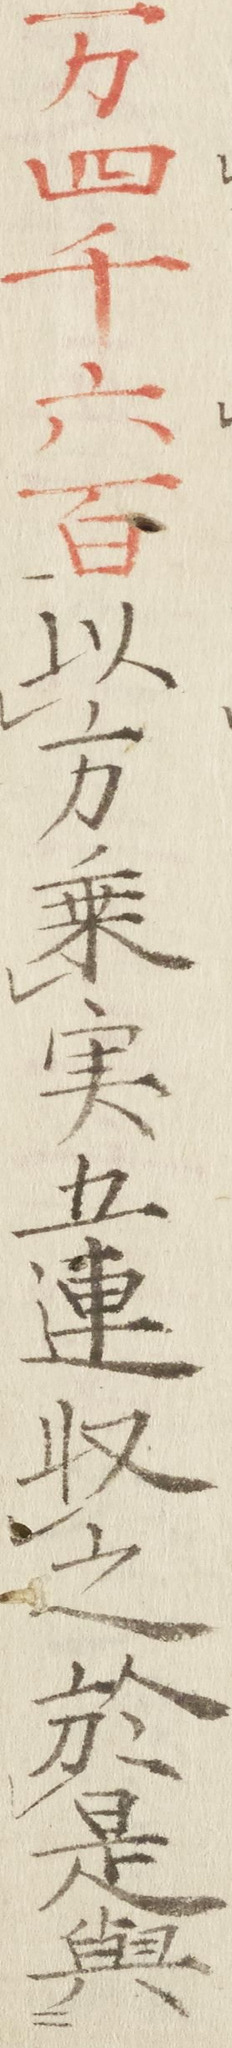万四千六百以方乗実五連収之於是与

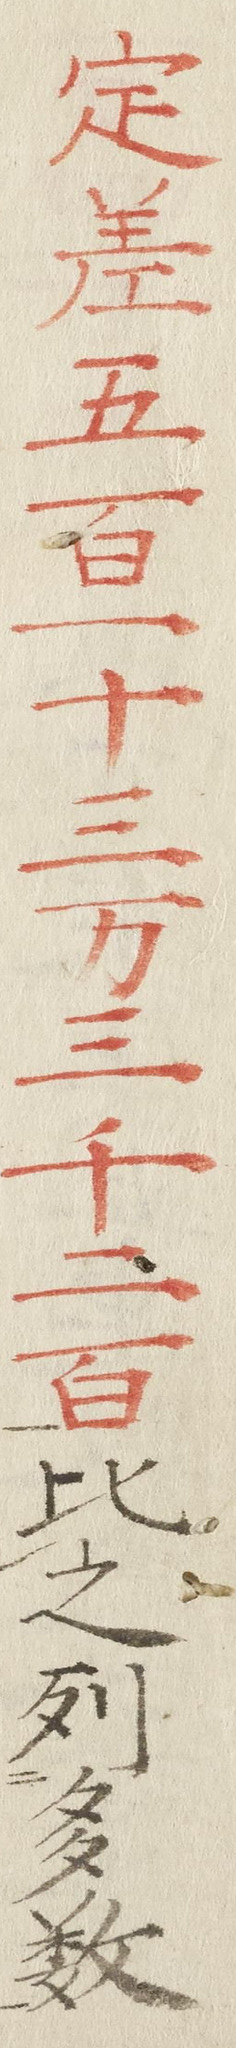定差五百一十三万三千二百此之列ニ多数
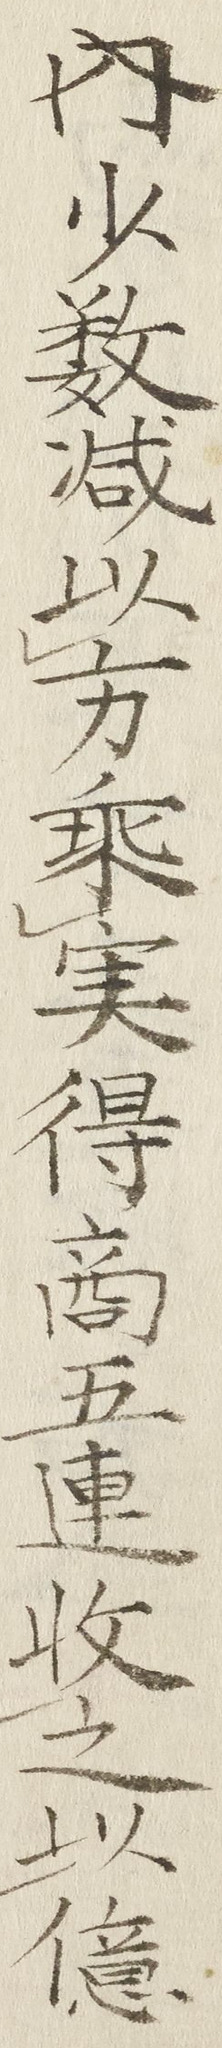内少数減以方乗実得商五連収之以億
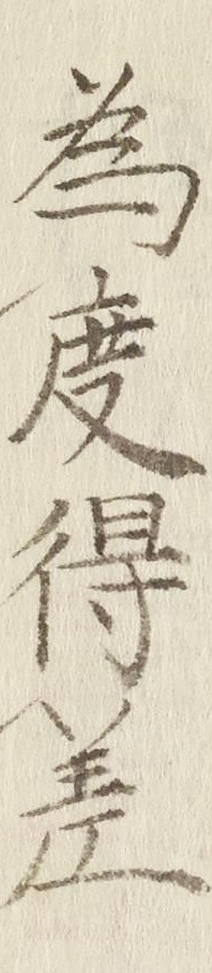為度得差
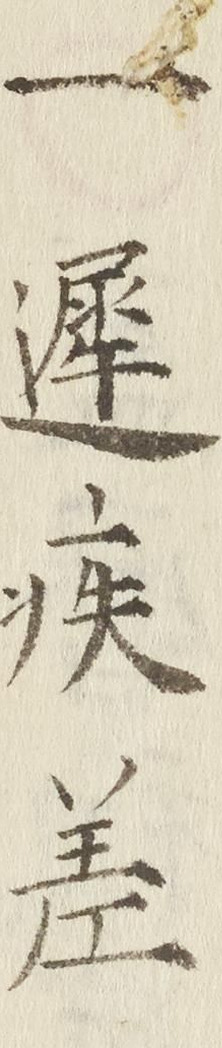一遅疾差
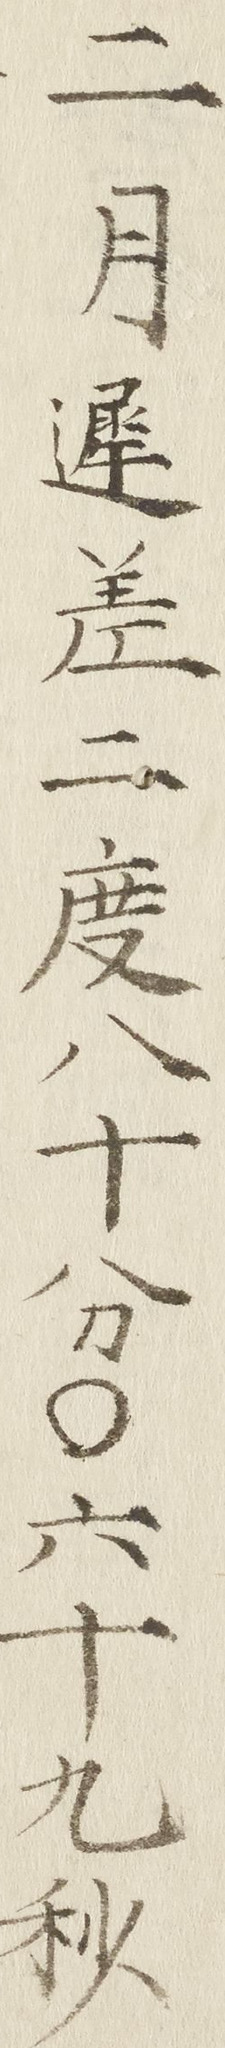二月遅差二度八十分〇六十九秒
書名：日食度
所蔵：東京大学地震研究所図書室 Earthquake Research Institute Library, The University of Tokyo, JAPAN
